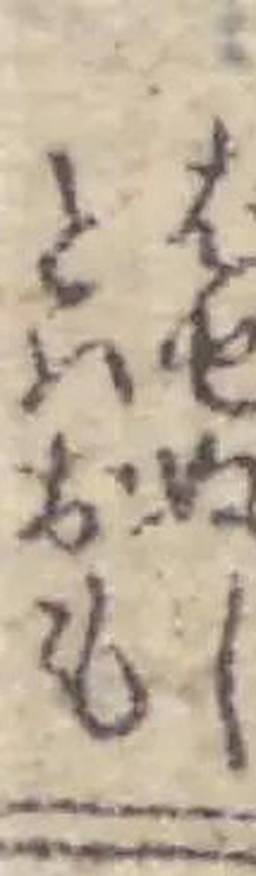とはおも
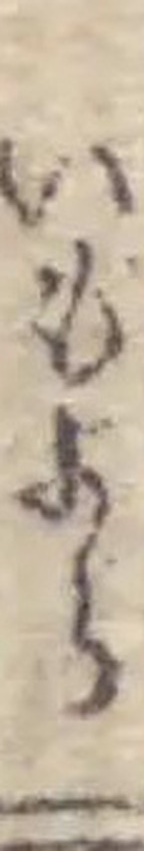いもよら
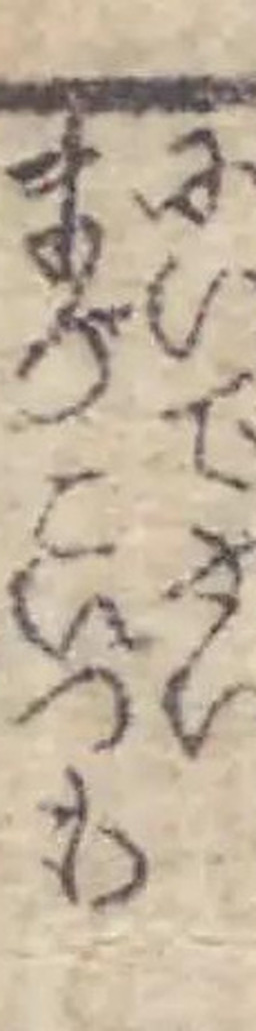まづこいつも
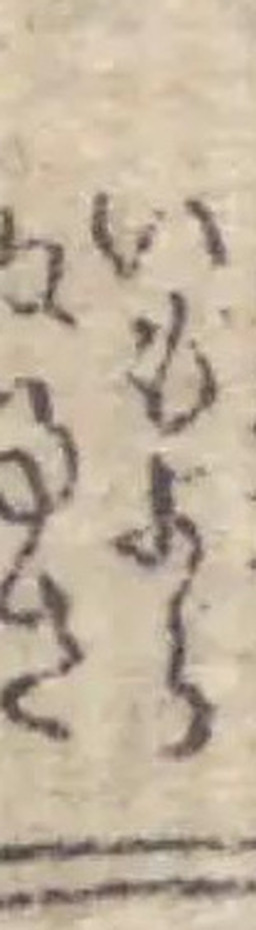ぬ事さ
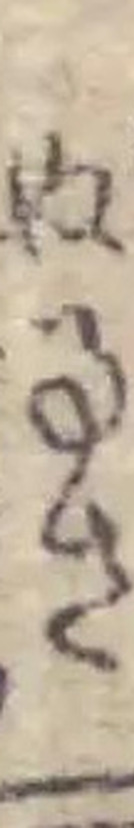ぬ事さ
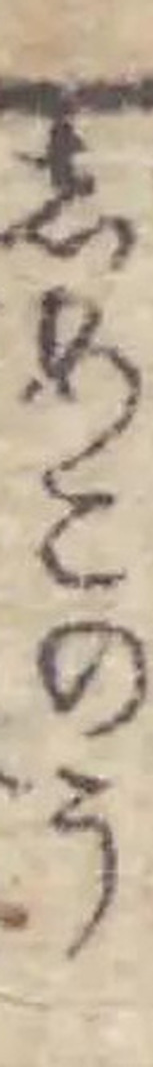しめこのう
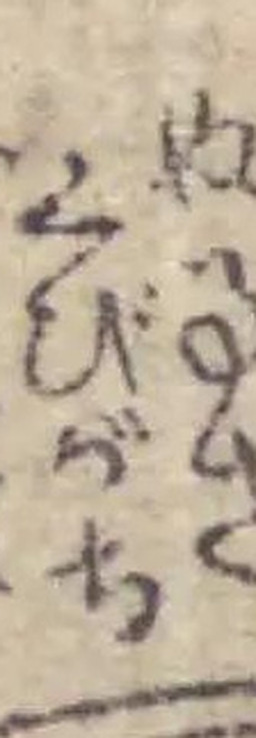くびがち
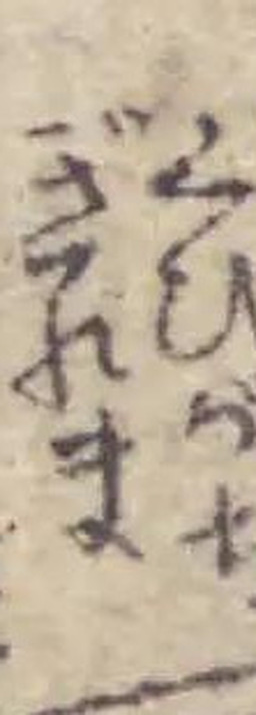ぎれま
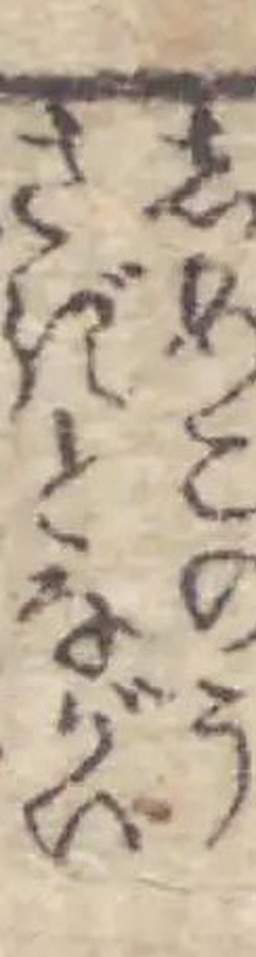さぎとながい
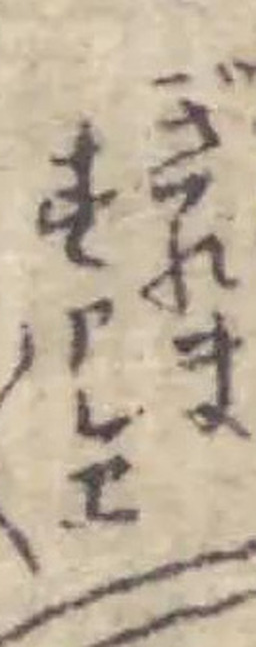すアレエ
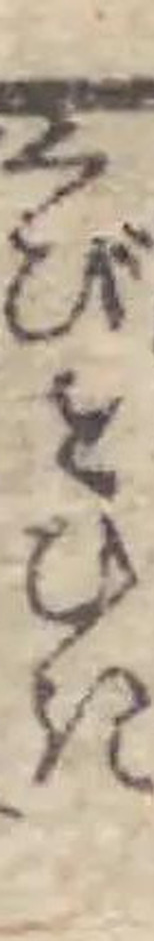くびをひき
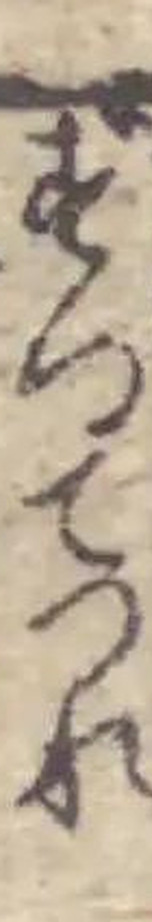ずつてつれ
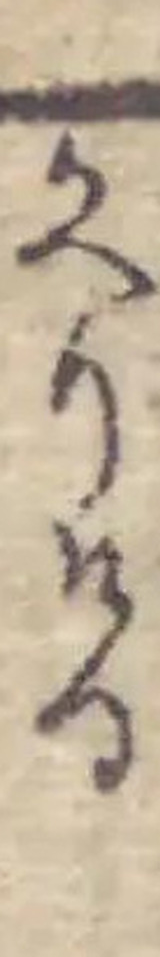かへりける
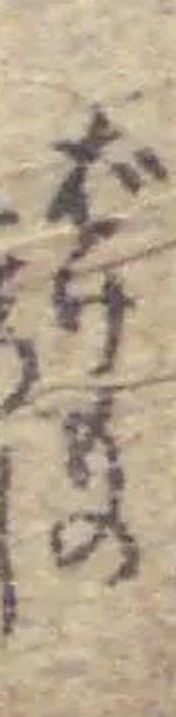ばけもの

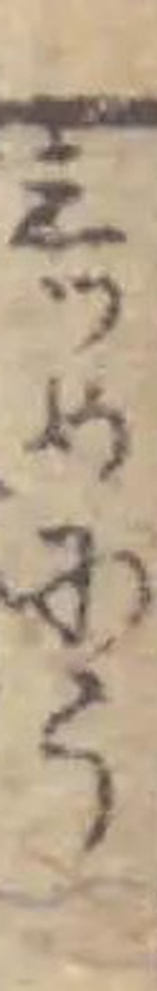三つめにう
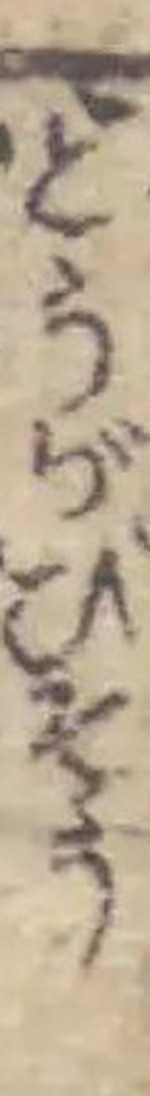どうがひそう
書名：化物尽 4巻
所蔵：国立国会図書館 National Diet Library, JAPAN
